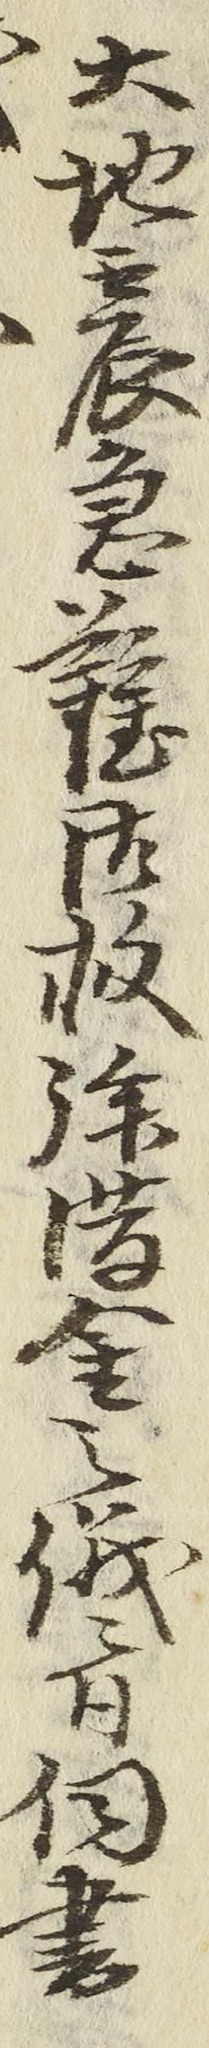大地震急難御救拝借金之儀二付伺書
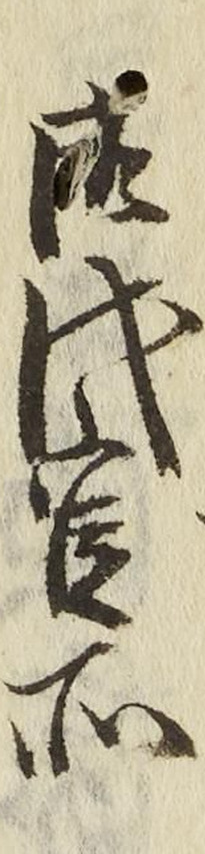御代官所
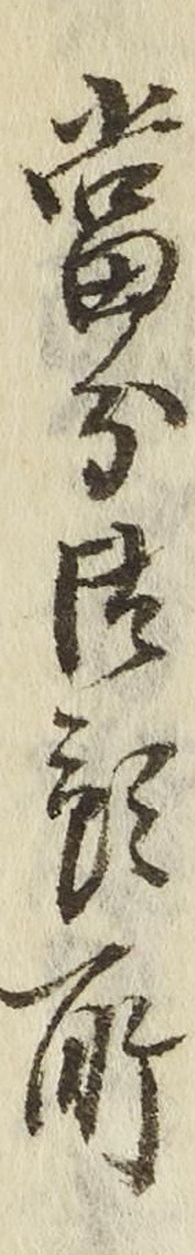当分御預所
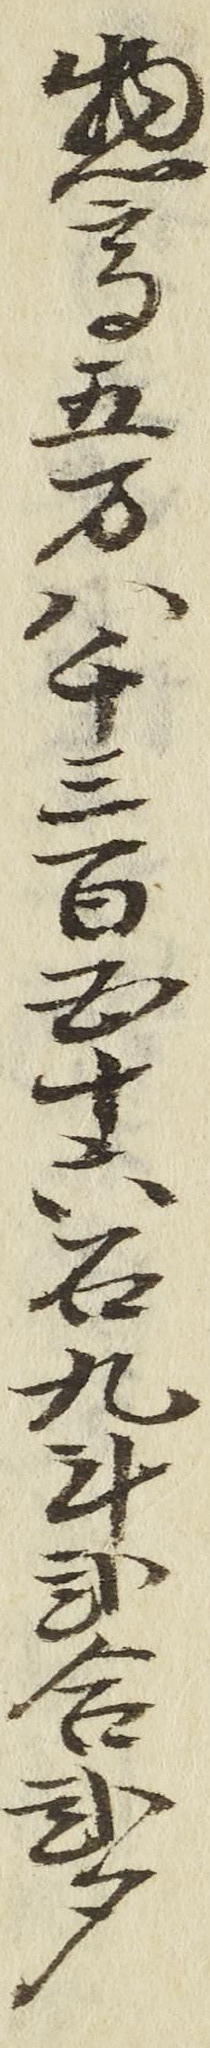惣高五万八千三百五十六石九斗弐合弐夕
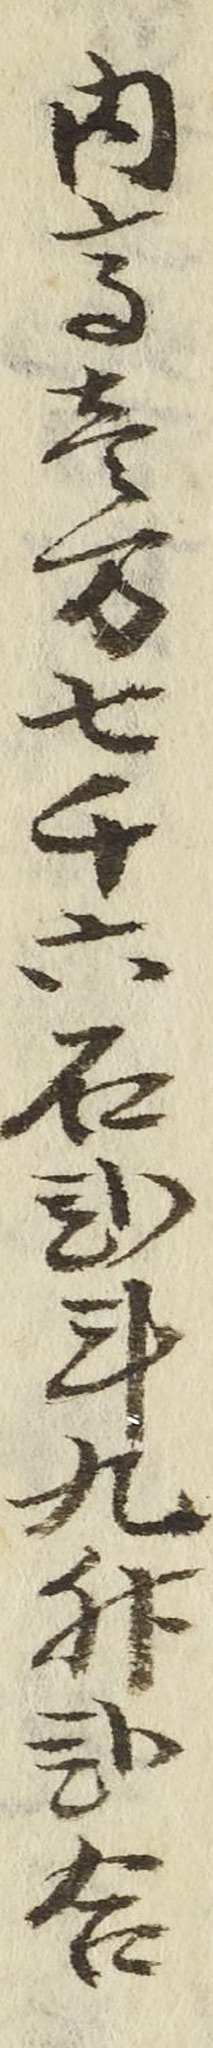内高壱万七千六石弐斗九升弐合
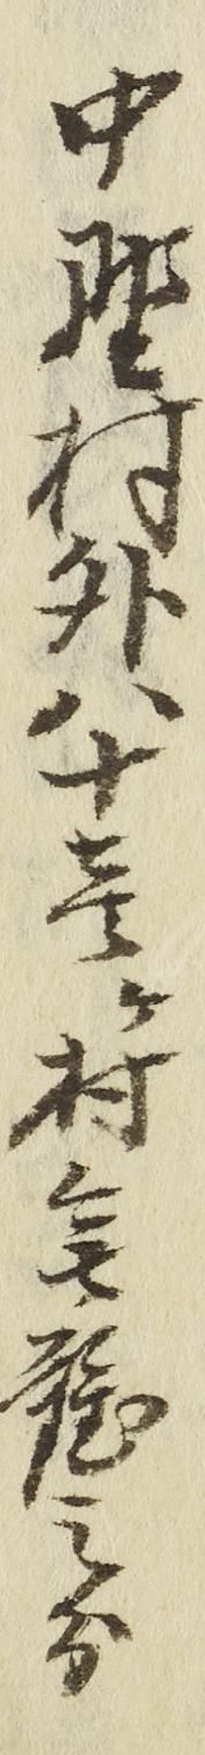中野村外八十壱ヶ村無難之分
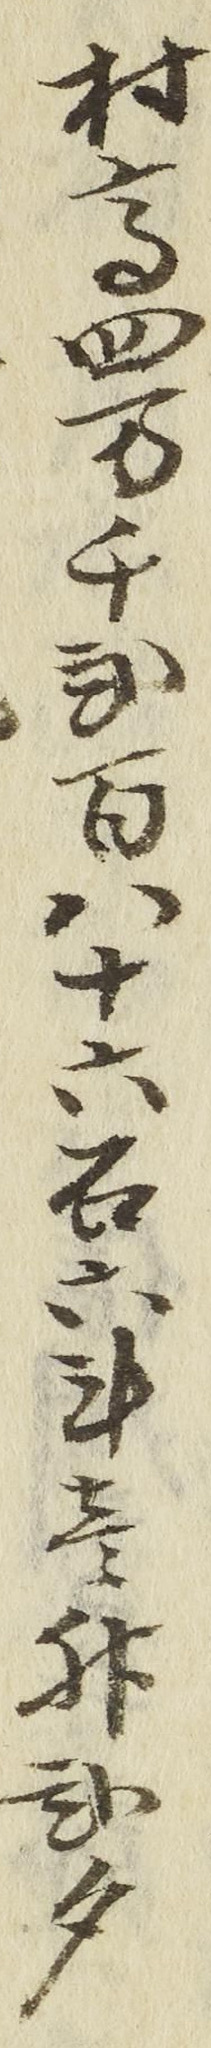村高四万千弐百八十六石六斗壱升弐夕
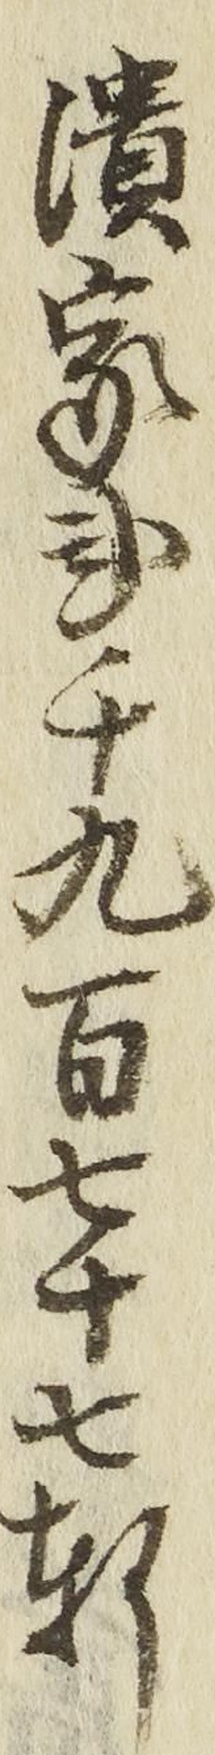潰家弐千九百七十七軒
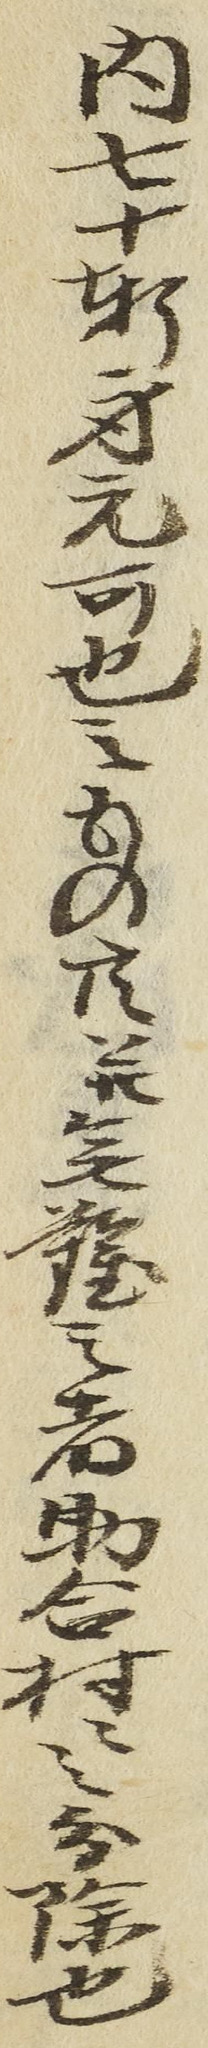内七十軒身元可也之もの共并無難之者助郷村々之分除也

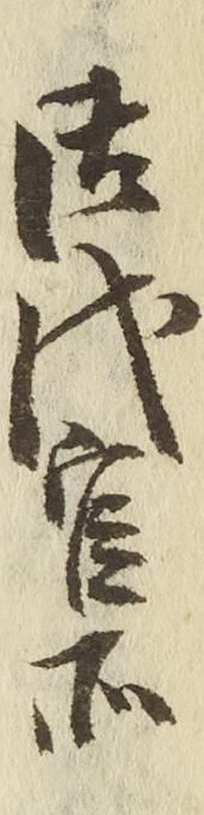御代官所
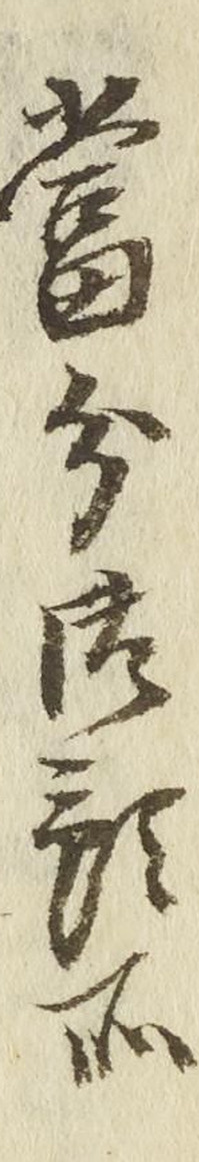当分御預所
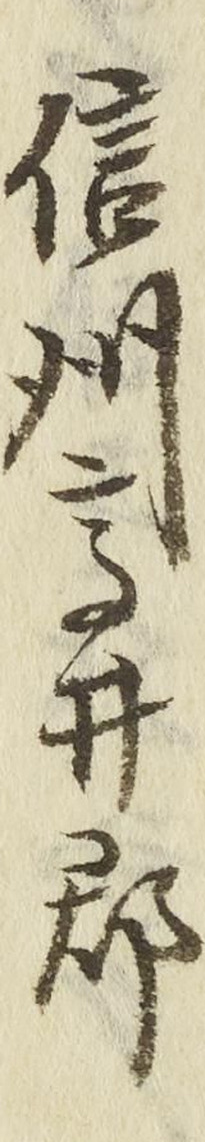信州高井郡
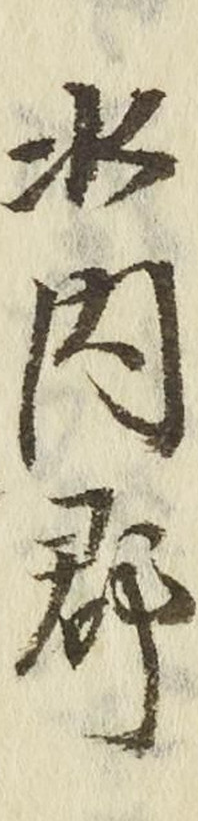水内郡
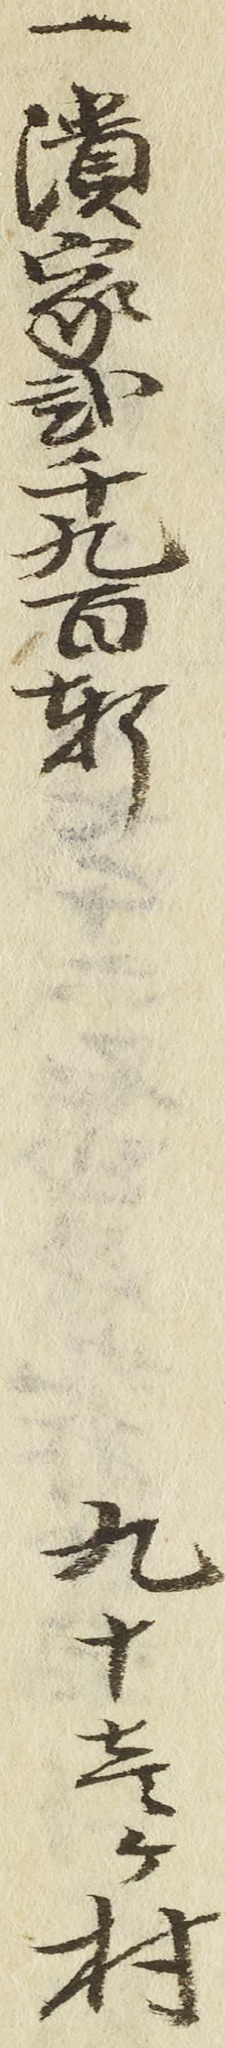一潰家弐千九百軒九十壱ヶ村
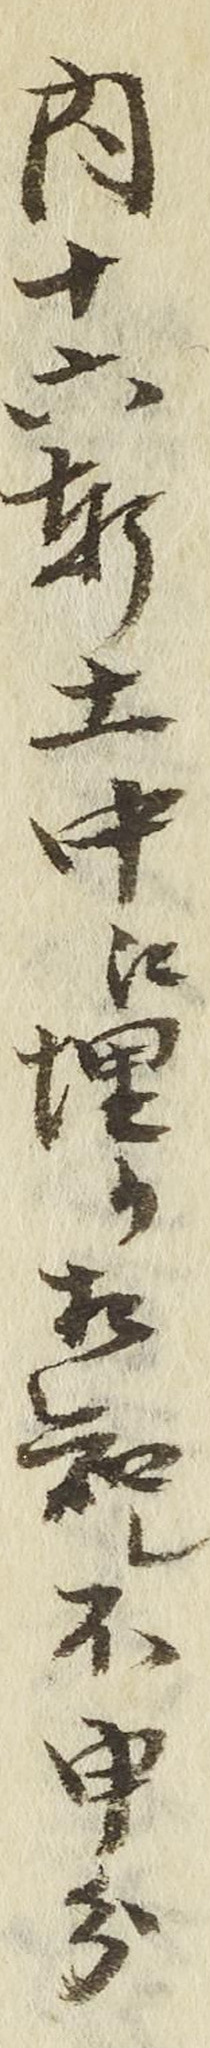内十六軒土中江埋り相知レ不申分
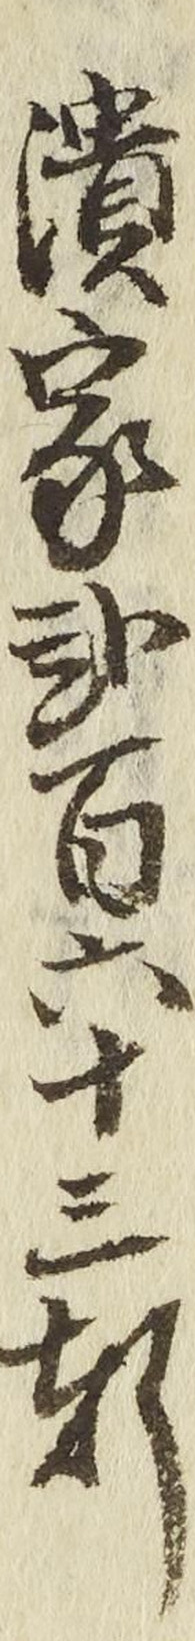潰家弐百六十三軒
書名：信濃國大地震記　乾
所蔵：東京大学地震研究所図書室 Earthquake Research Institute Library, The University of Tokyo, JAPAN
